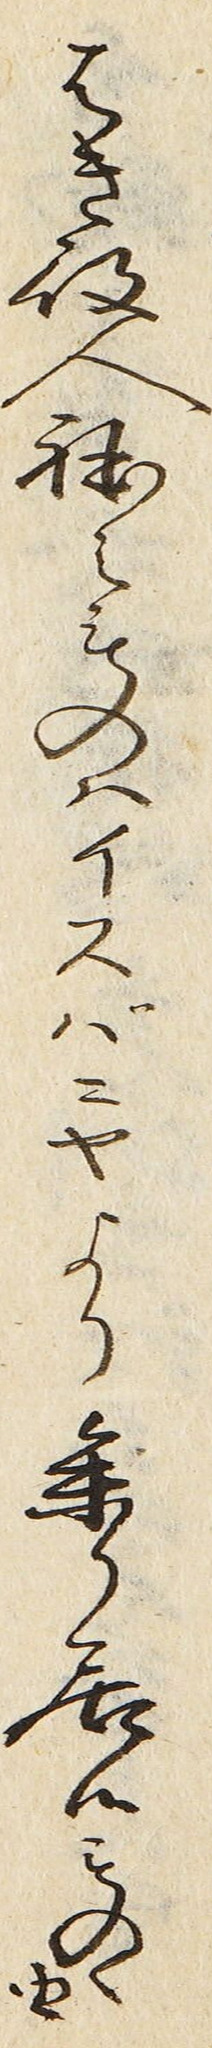はき役人躰之ものはイスパニヤより参り居候もの候由
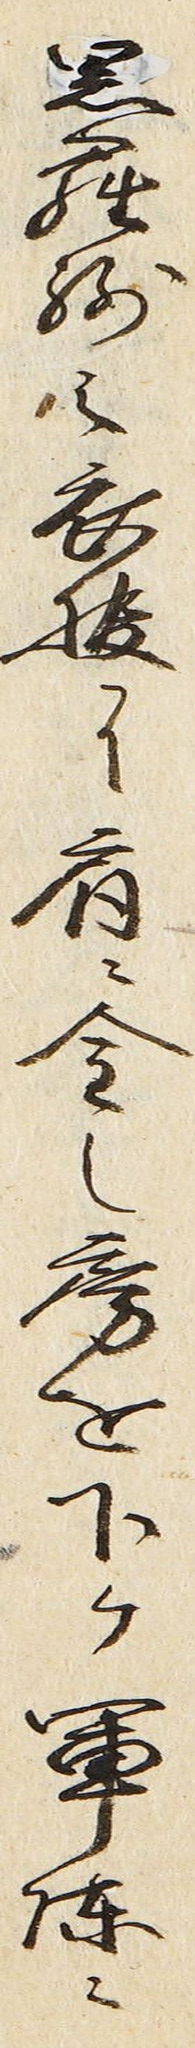黒羅紗之衣服に肩に金之房を下け軍陳に
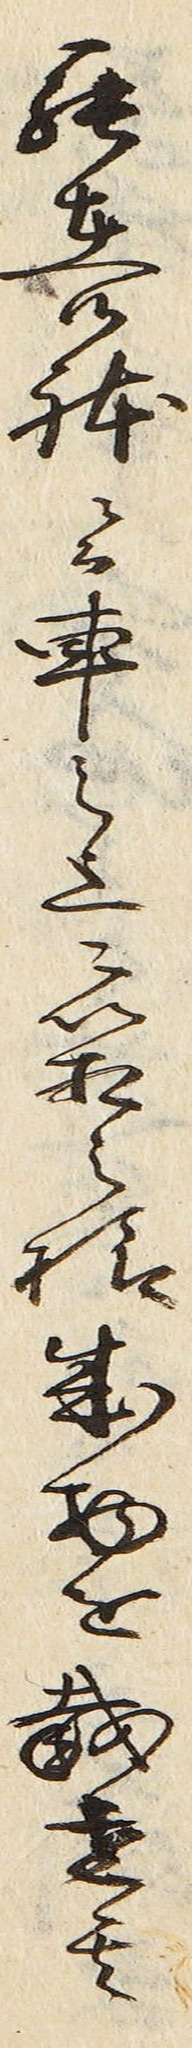罷在候躰に而車之上に箱之様成物を載せ其
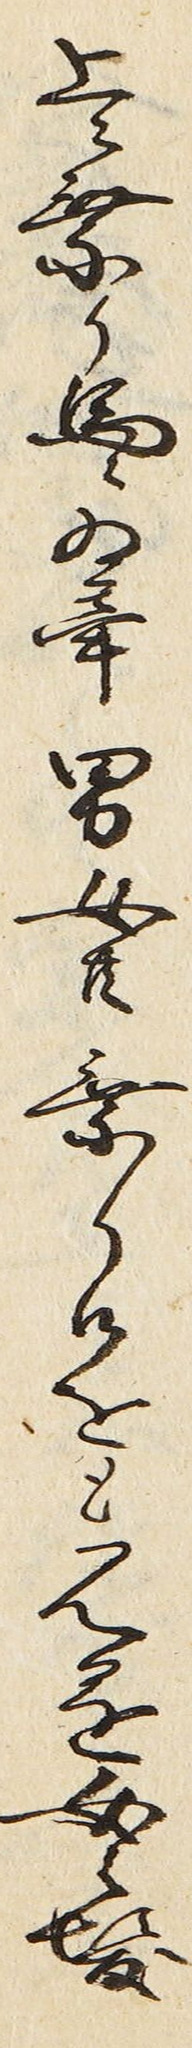上に乗り馬に為牽男女共乗り候をも見懸女之髪
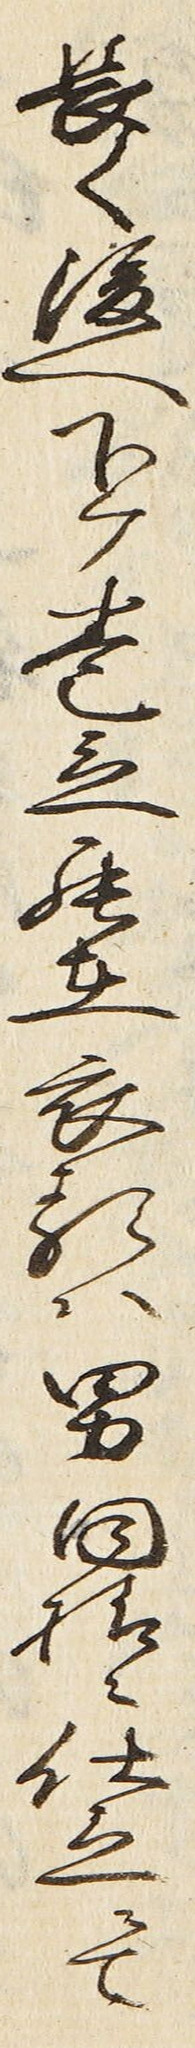長く後へ下け巻立罷在衣類は男同様に仕立にて
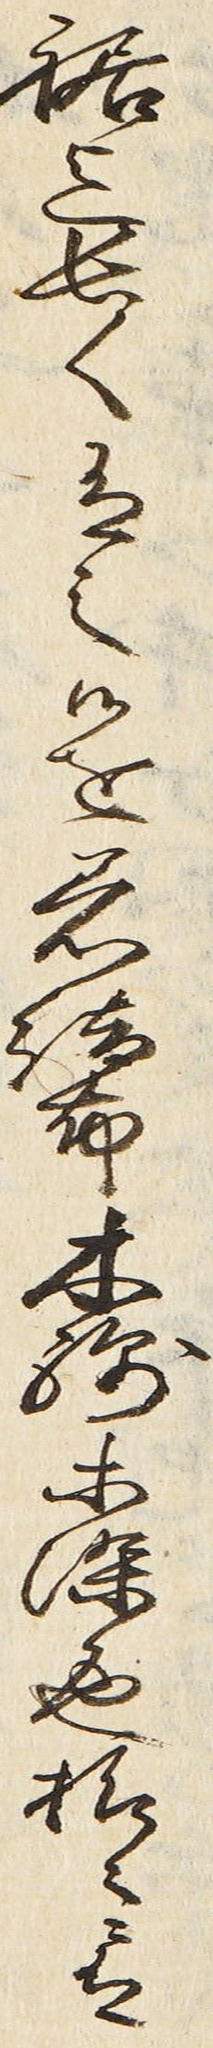裾迄長く有之候を着結布木綿等染色様々に有
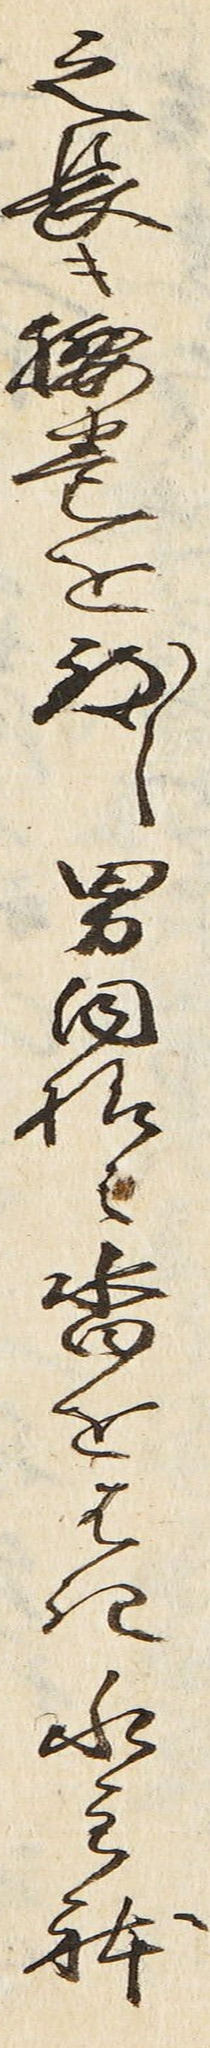之長き腰巻を致し男同様之沓をはき水主躰
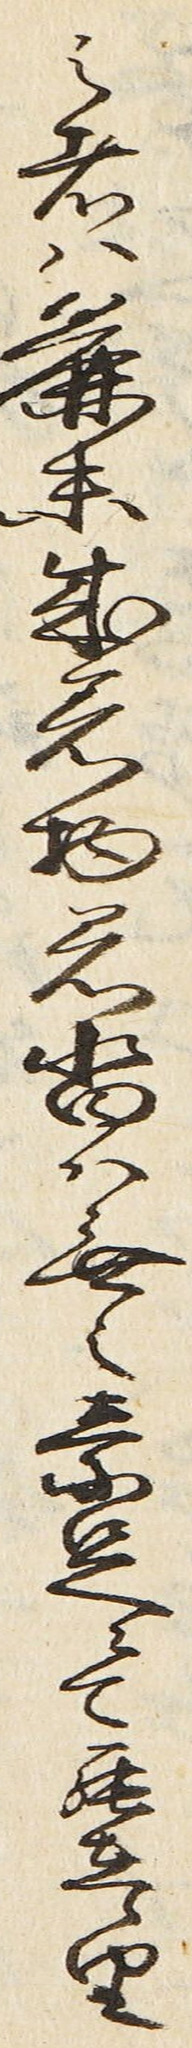之者は麁末成着物着屈は沓は無之素足にて罷在候由
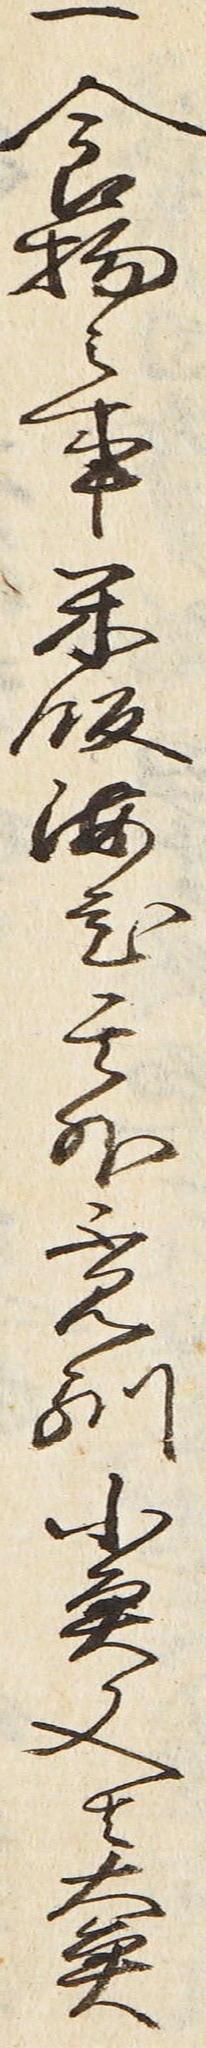一食物之事米飯海老其外不見馴小魚又は大魚
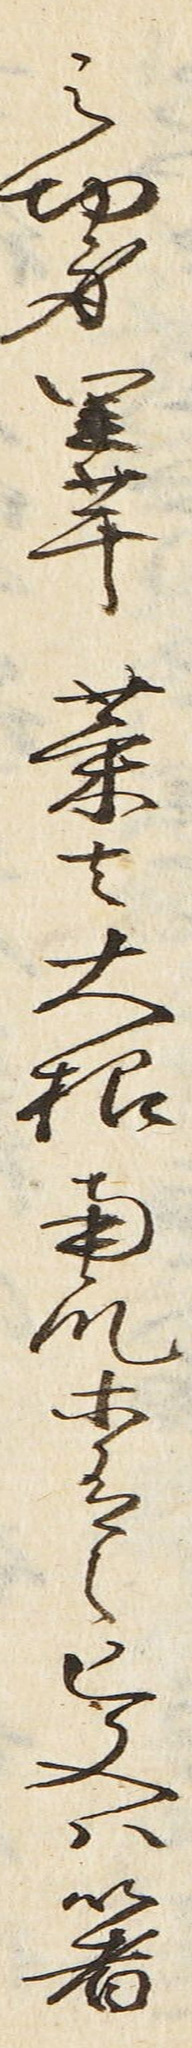之切身里芋菜は大根南瓜等有之匕又は箸
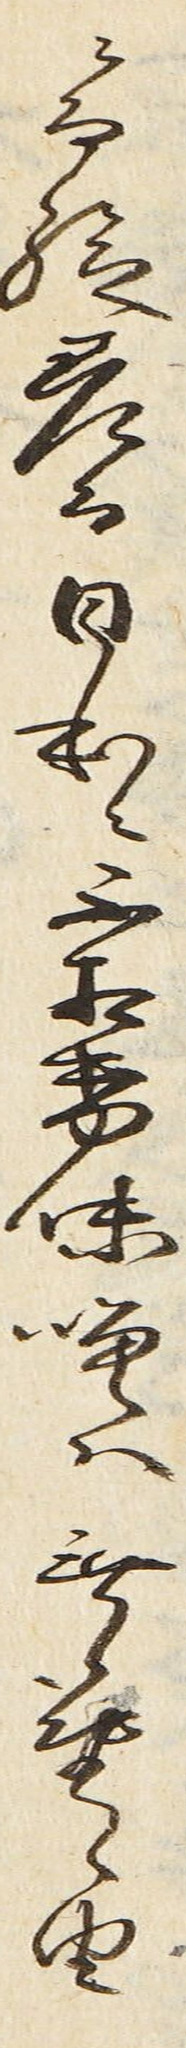に而給差而日本に不相希味噌は無御坐候由
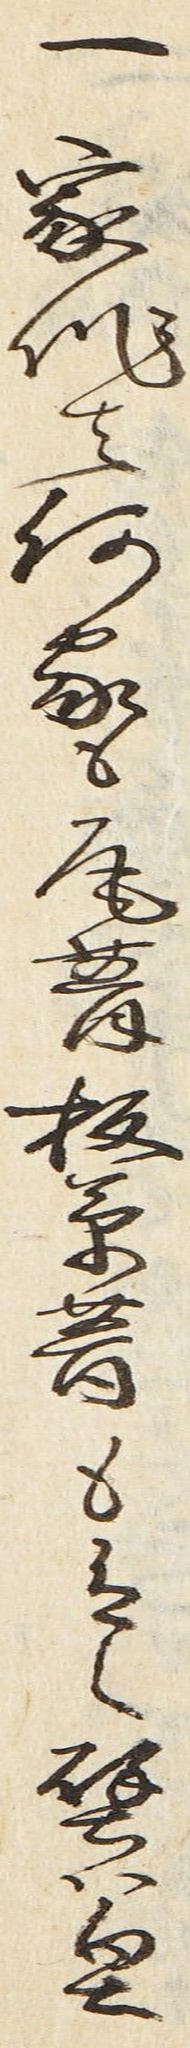一家作は何家も瓦葺板草葺も有之壁は白土
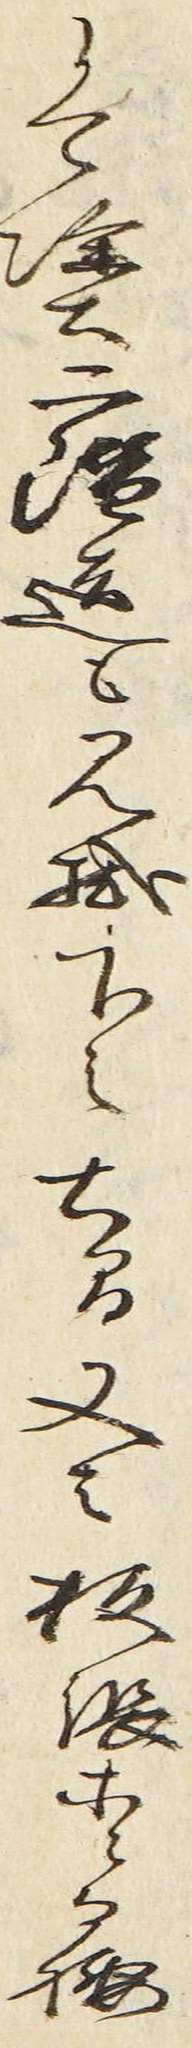にて塗二階造も見掛下之土間又は板張等に而腰
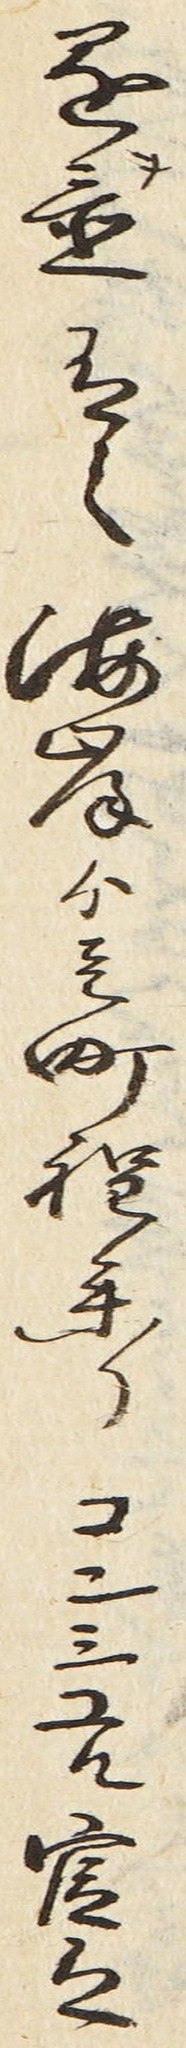懸置有之海岸ゟ壱町程参りコンシユル官有

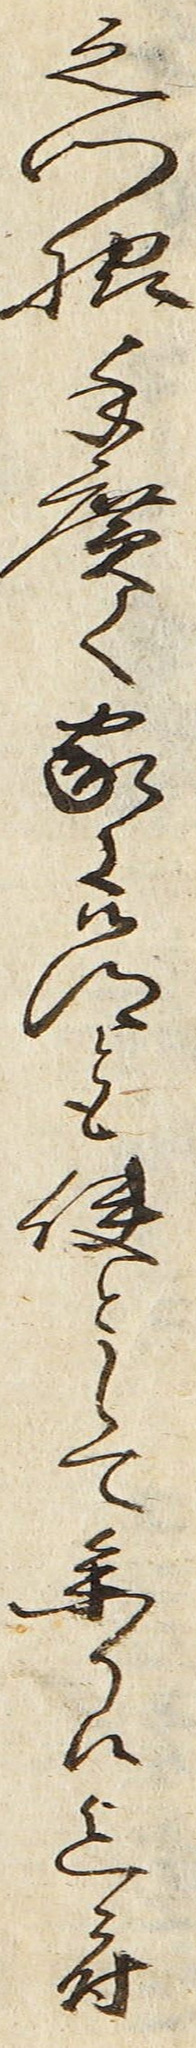之門脇手広く家に候得とも使として参り候迄に付
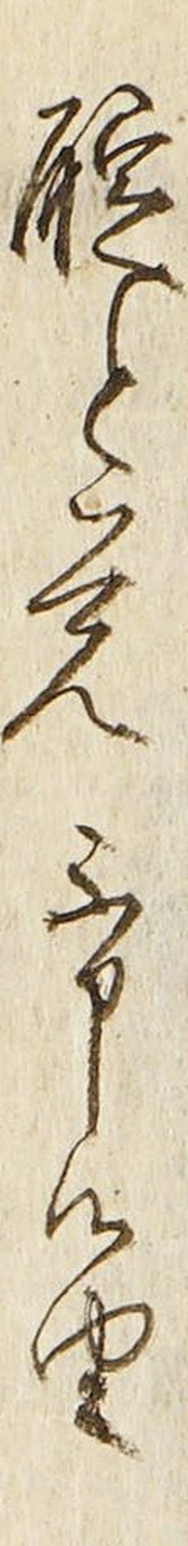聢と覚不申候由
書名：土佐中浜万次郎漂流記
